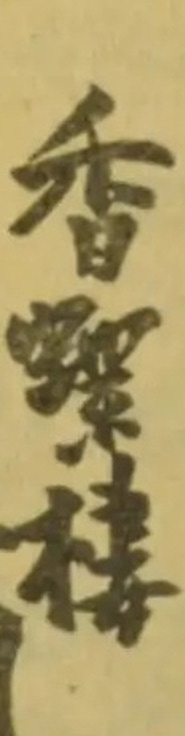香蝶楼
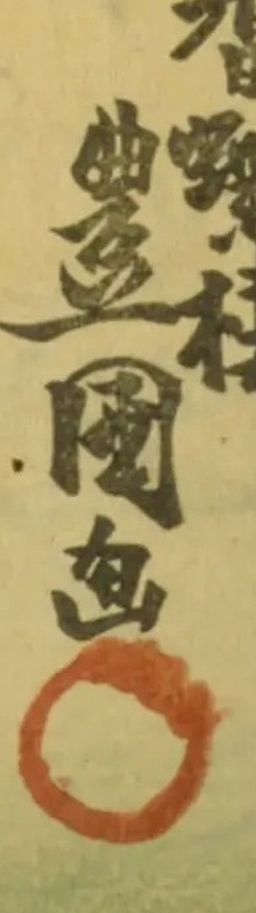豊国画
